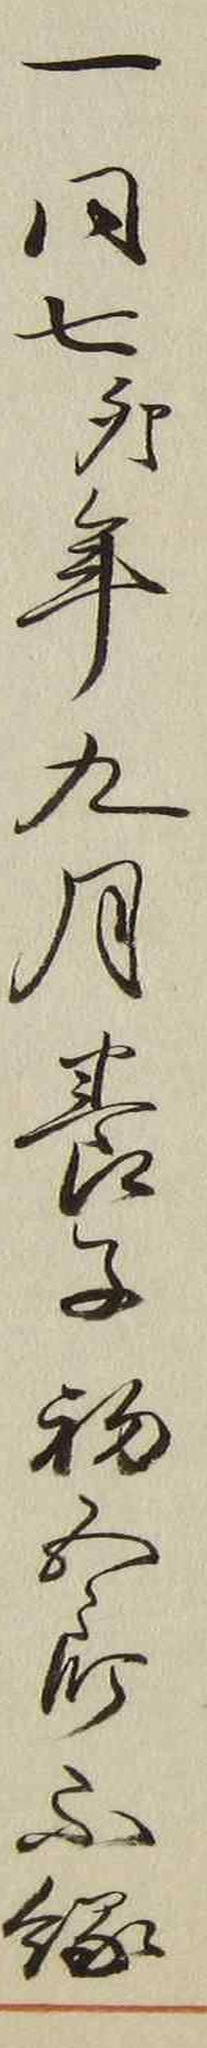一同七卯年九月養子初五郎不縁
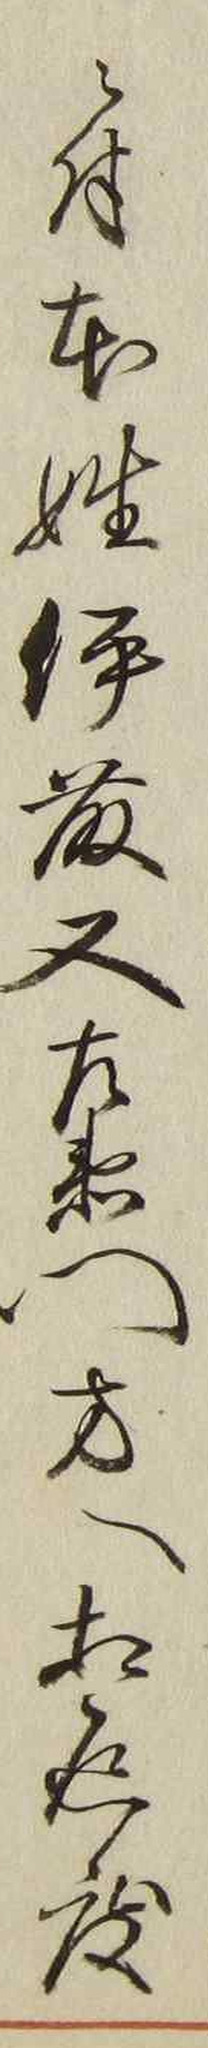ニ付本姓伊藤又左衛門方へ相返度

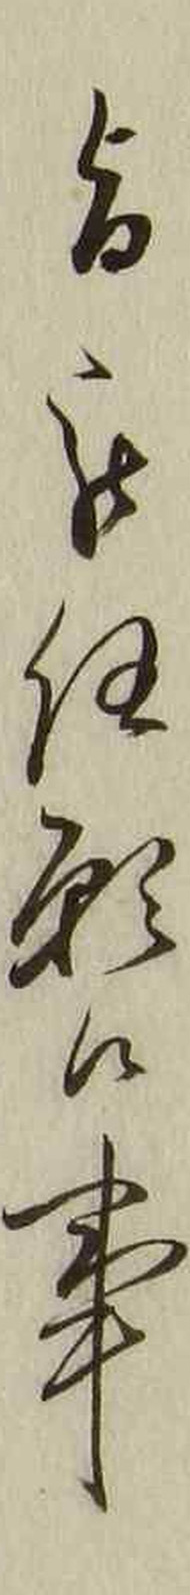旨被任願候事
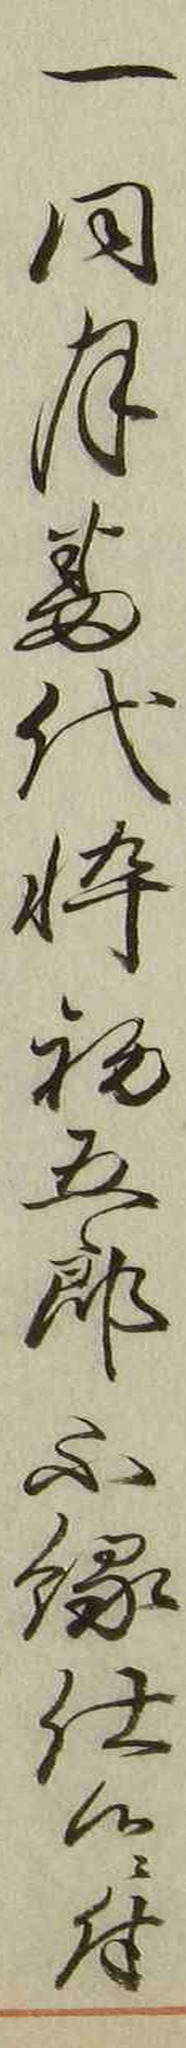一同月番代忰初五郎不縁仕候二付
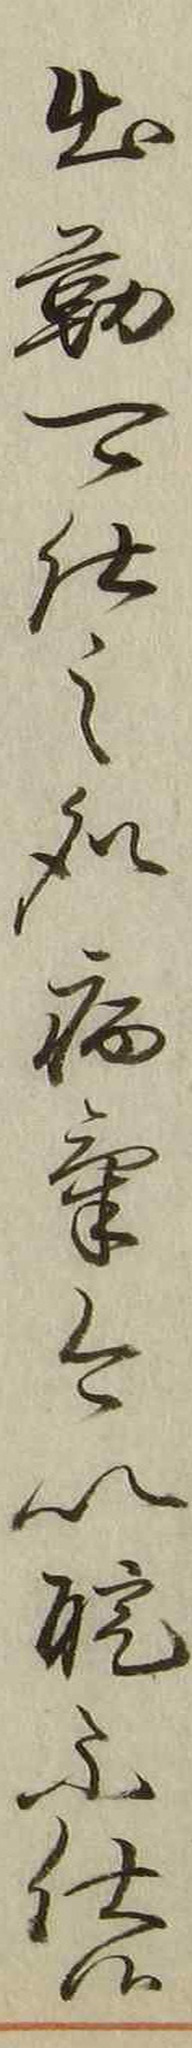出勤可出勤仕之処病気今以聢不仕候
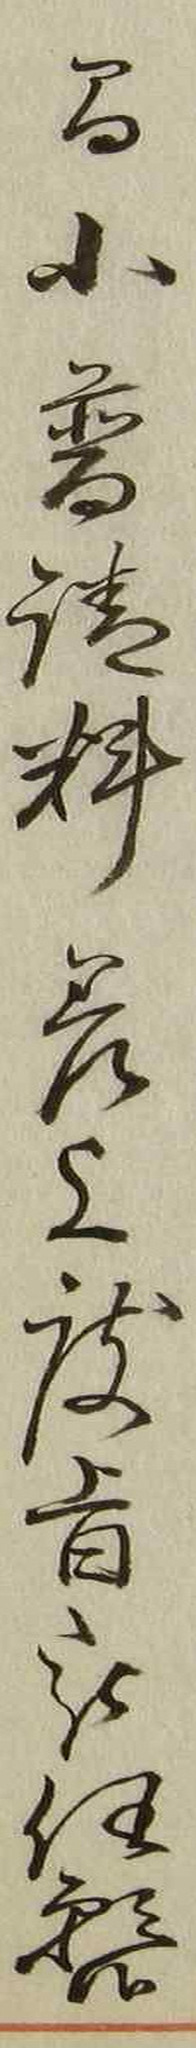間小普請料差上度旨被任願候
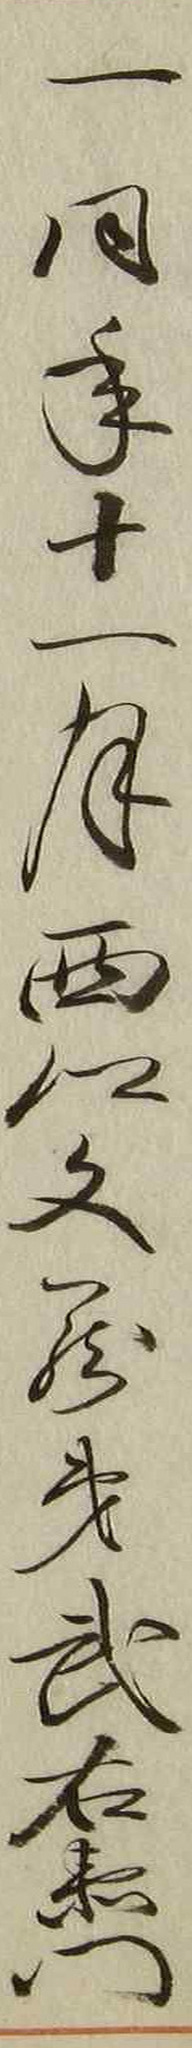一同年十一月西郷久蔵弟武右衛門
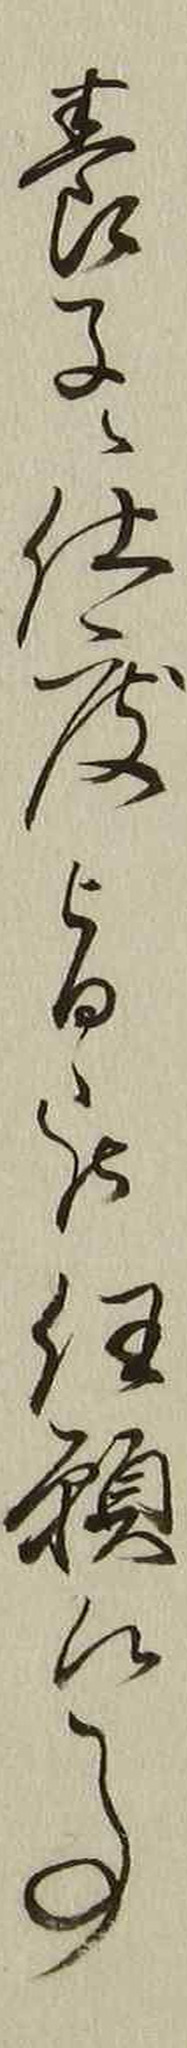養子ニ仕度旨被任願候事
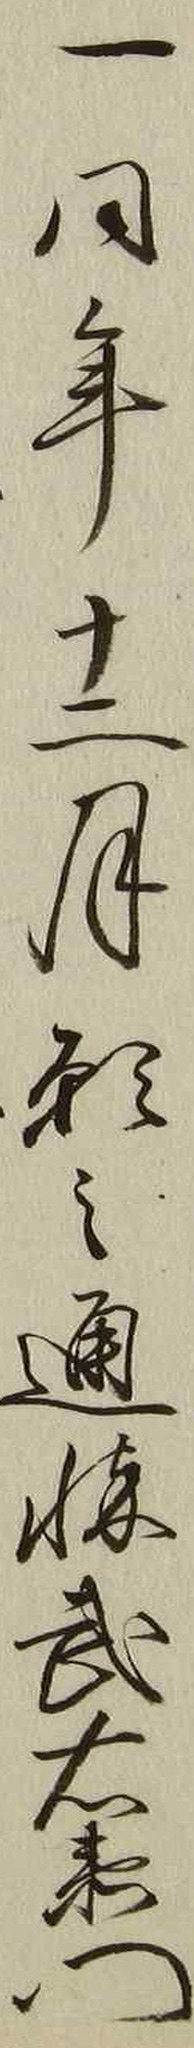一同年十二月願之通忰武右衛門
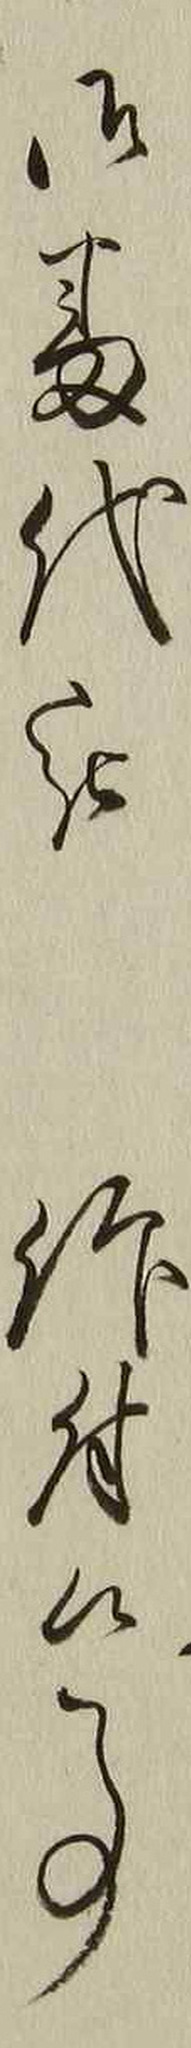御番代被仰付候事
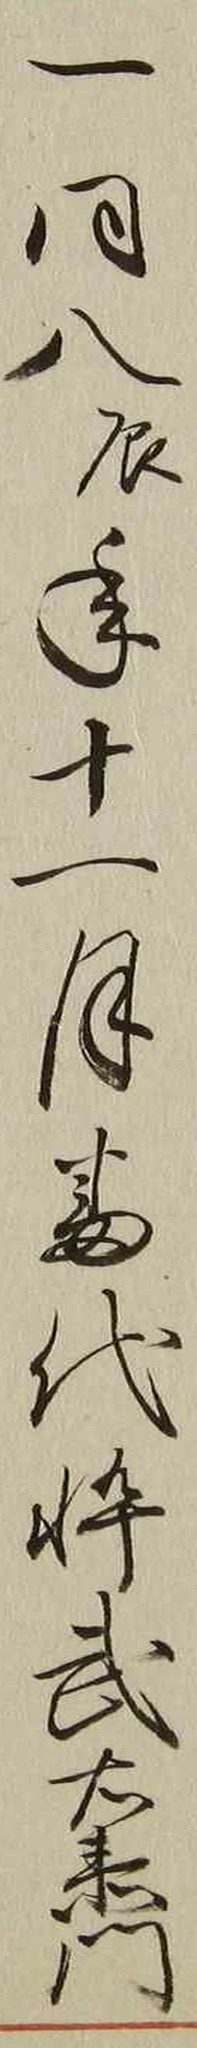一同八辰年十一月番代忰武右衛門
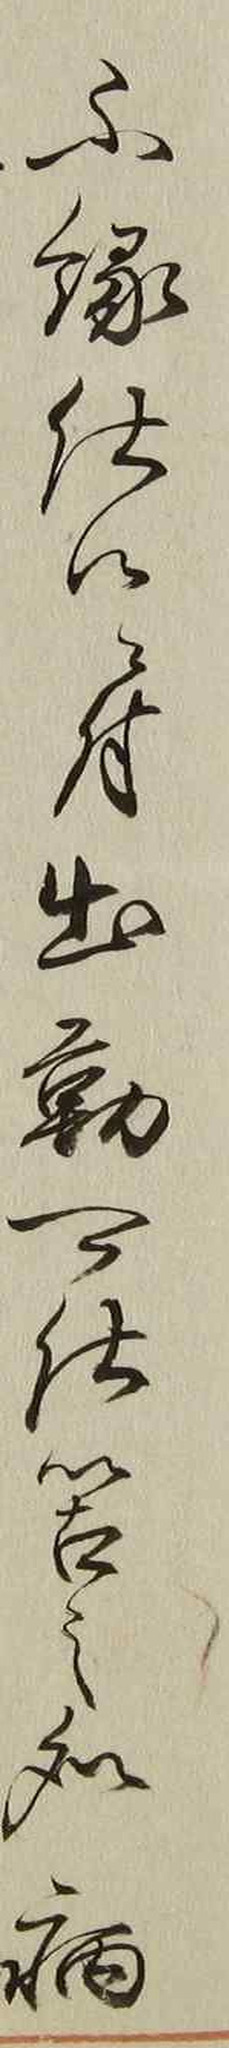不縁仕候ニ付出勤可仕筈之処病
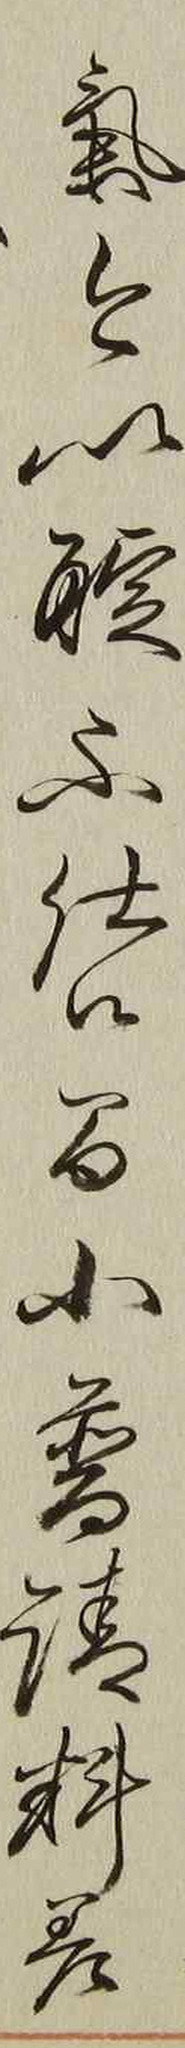気今以聢不仕候間小普請料差
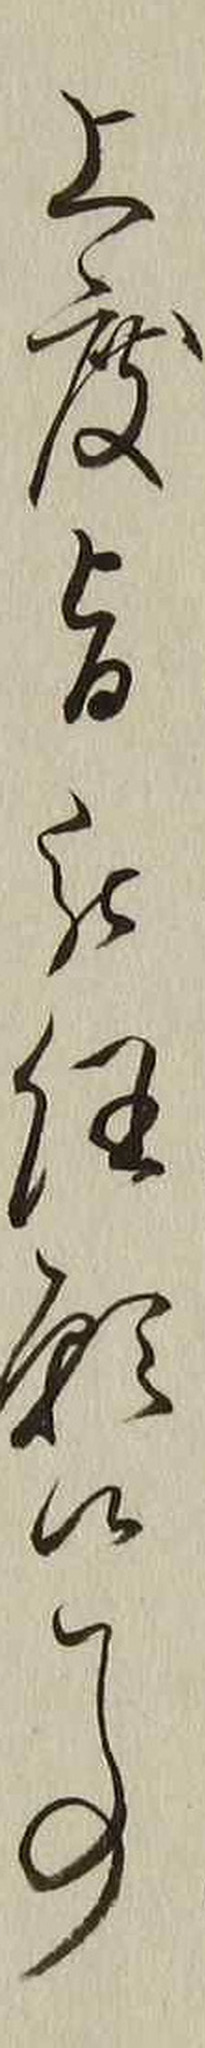上度旨被任願候事
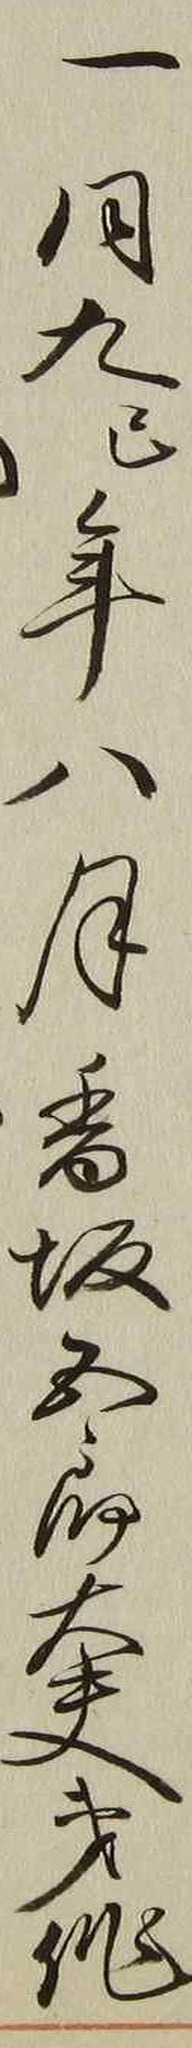一同九巳年八月香坂五郎大夫弟作
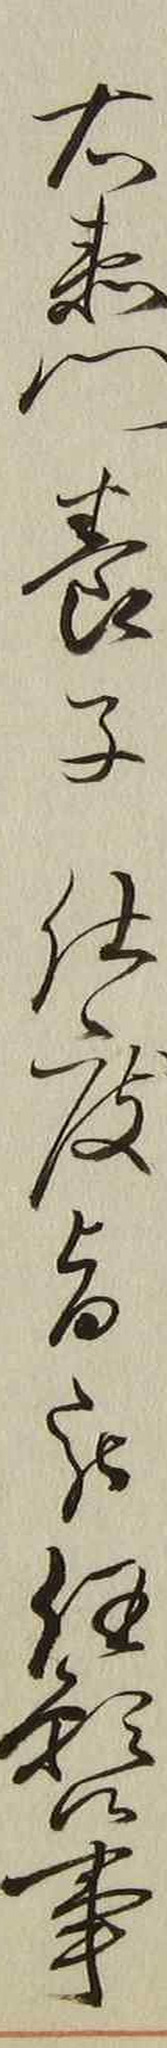右衛門養子仕度旨被任願候事
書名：諸士系譜　巻之54　ほ之部1
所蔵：会津若松市立会津図書館
